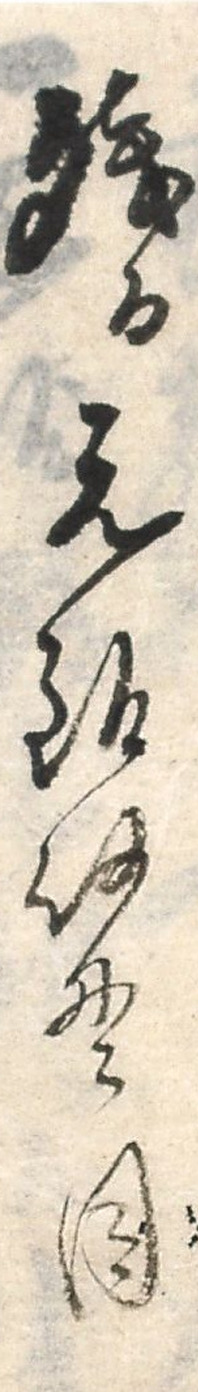残る元銀何貫目
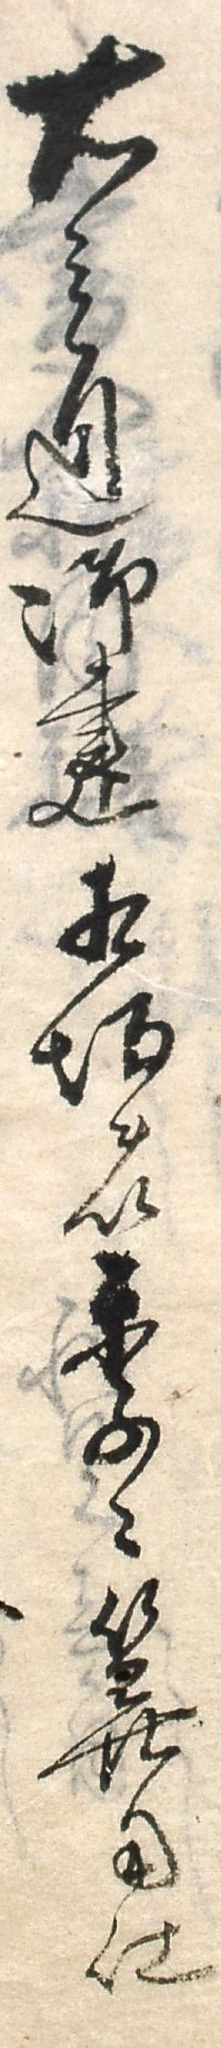右之通御建相場を以季々算用仕
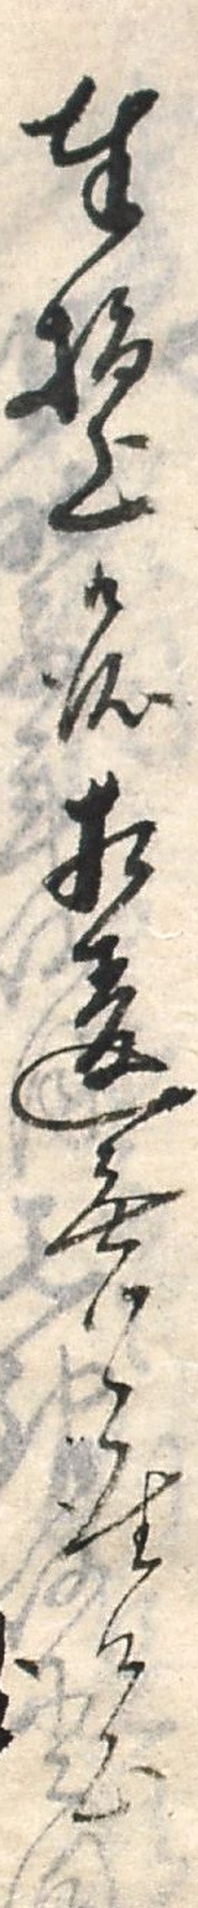奉指上候処相違無御座候以上
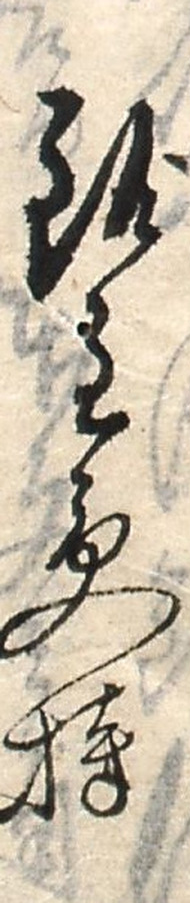銀主受持
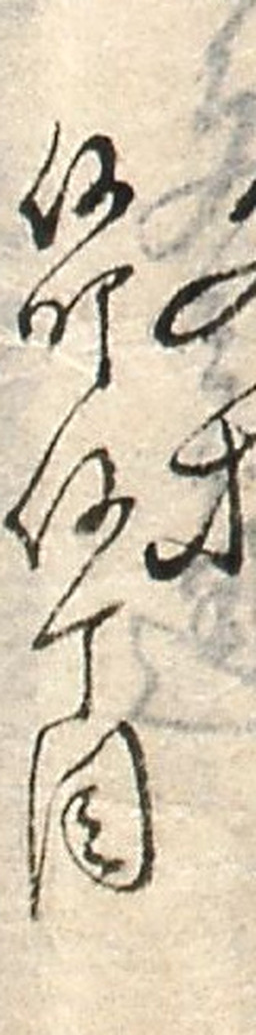何町何丁目
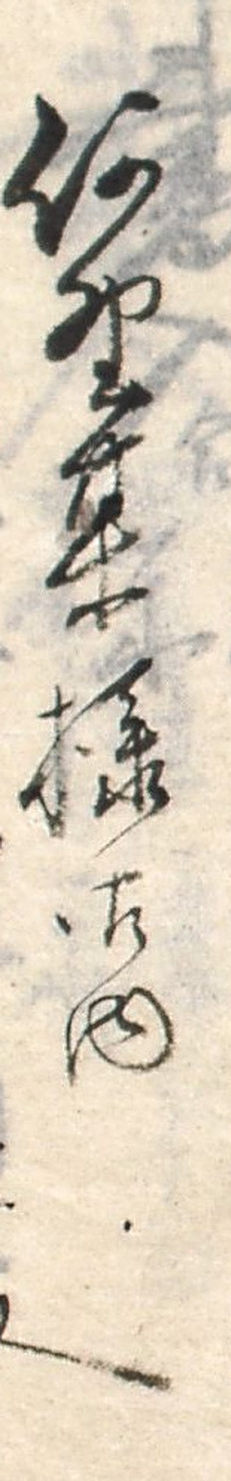何野某様御内
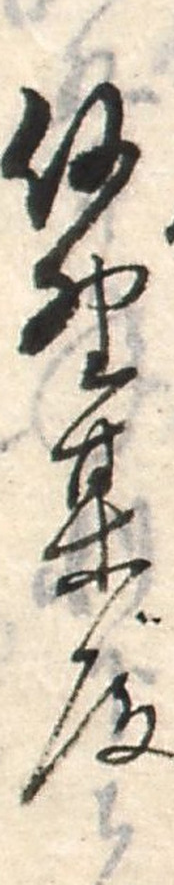何野某殿
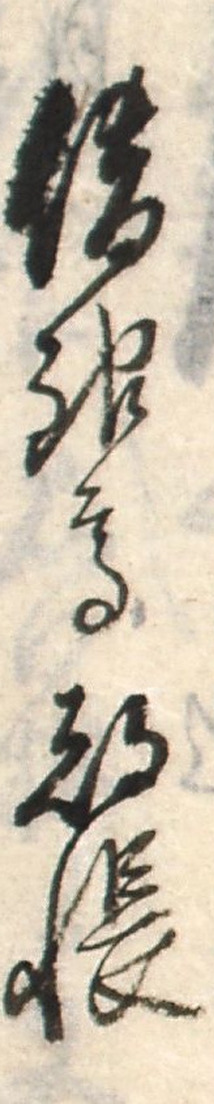借銀高都帳
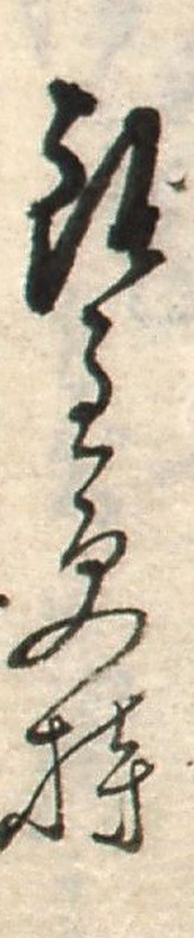銀主受持

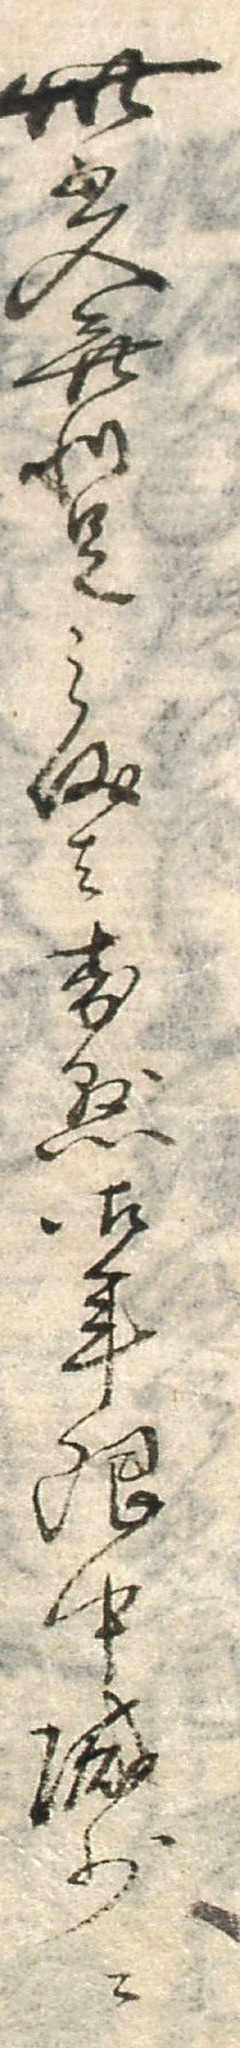此書入幷利足之儀は歩懸御年限中減少に
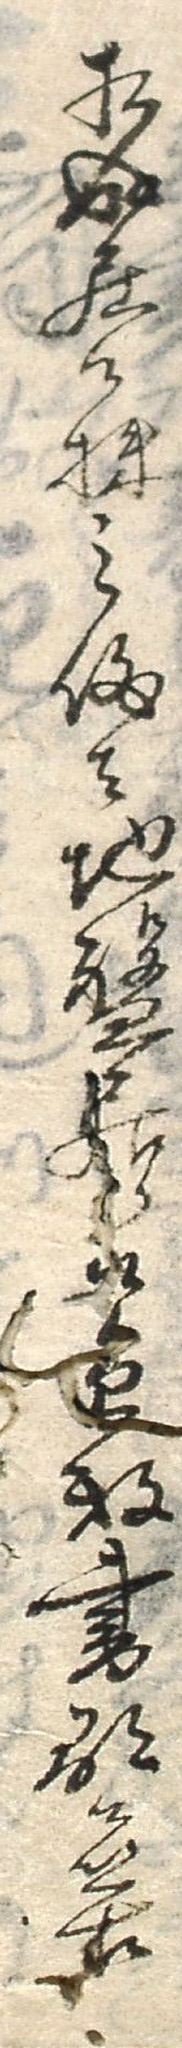相成居候株之儀は地盤居り候員数書顕候筈
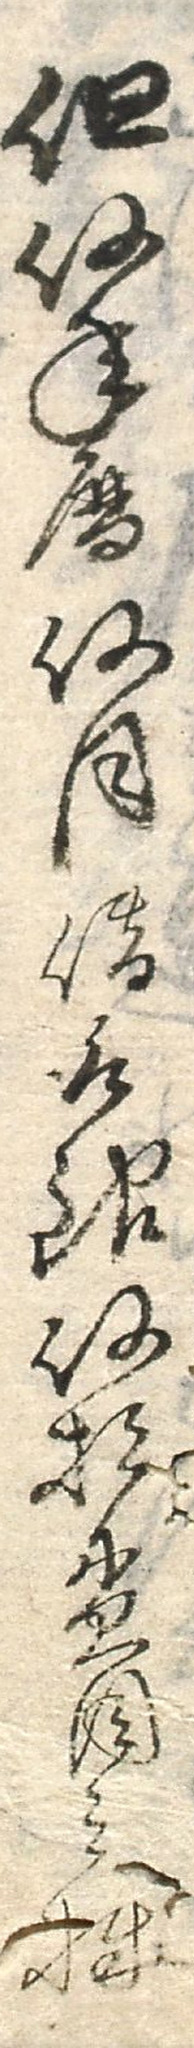但何年暦何月借取銀何拾貫目之株
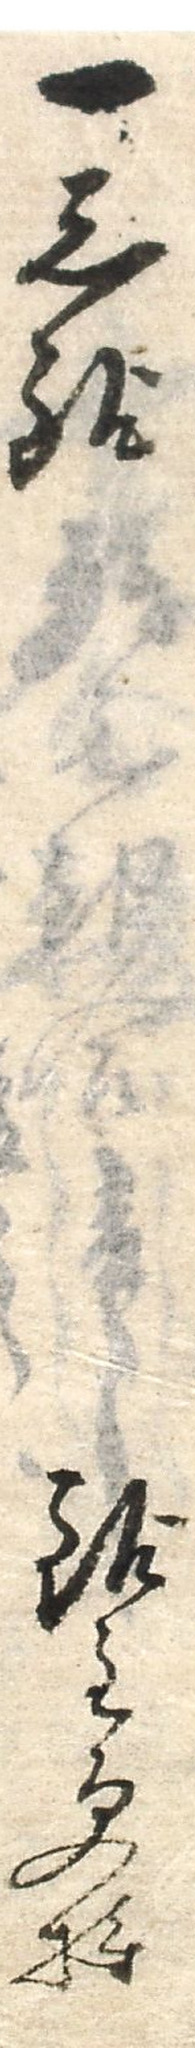一元銀銀主受持
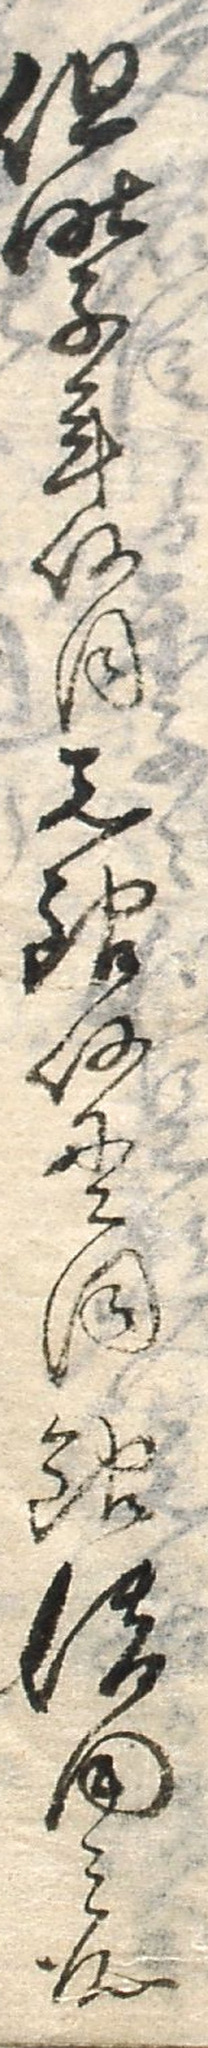但昨子年何月元銀何貫目銀借用之所
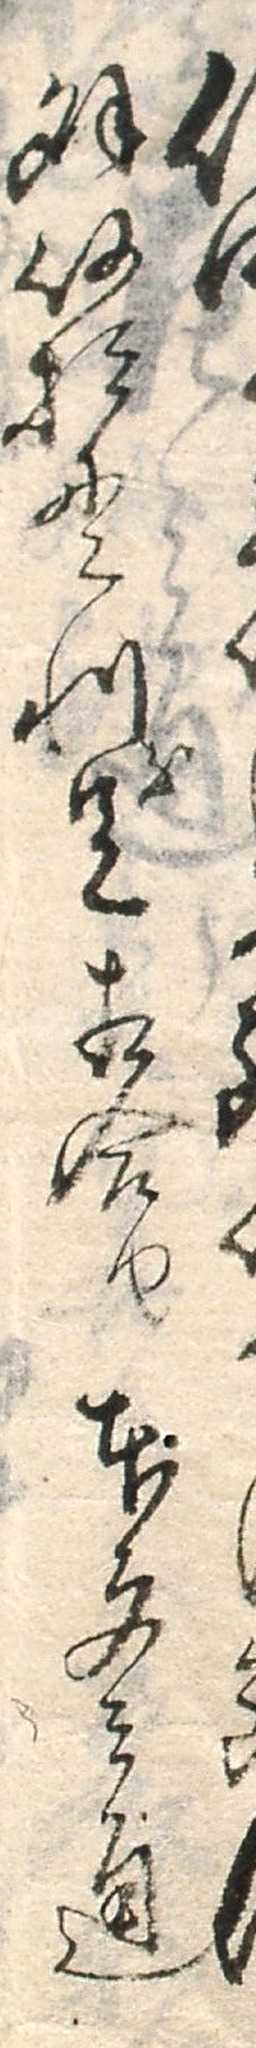外何拾貫利足相合せ本文之通
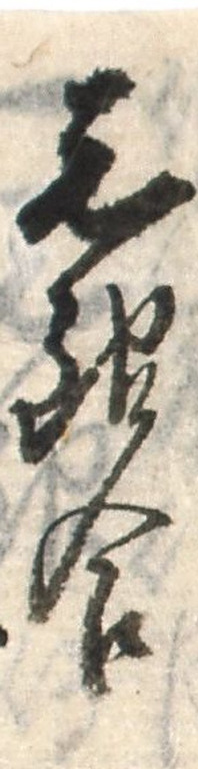元銀合
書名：御家中并無格御奉公人借銀御仕解一件御書付写其余共控
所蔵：鳴門教育大学 Naruto University of Education
